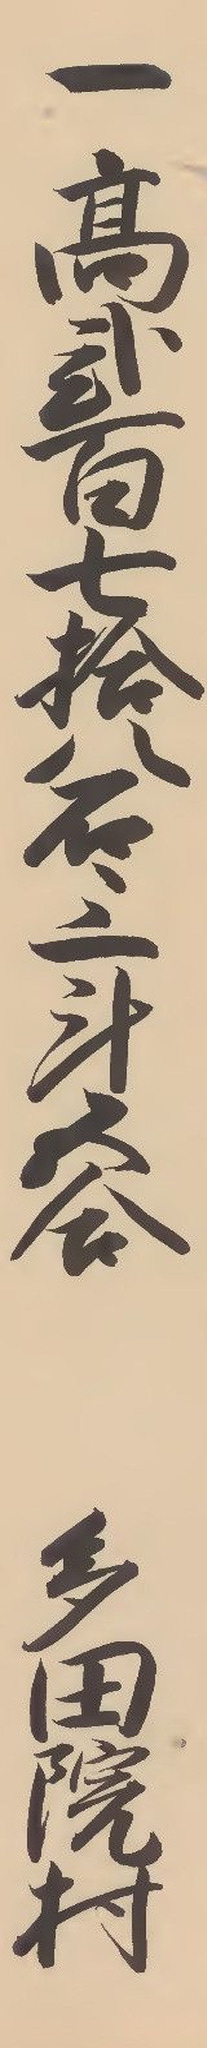一高弐百七拾八石三斗五合多田院村
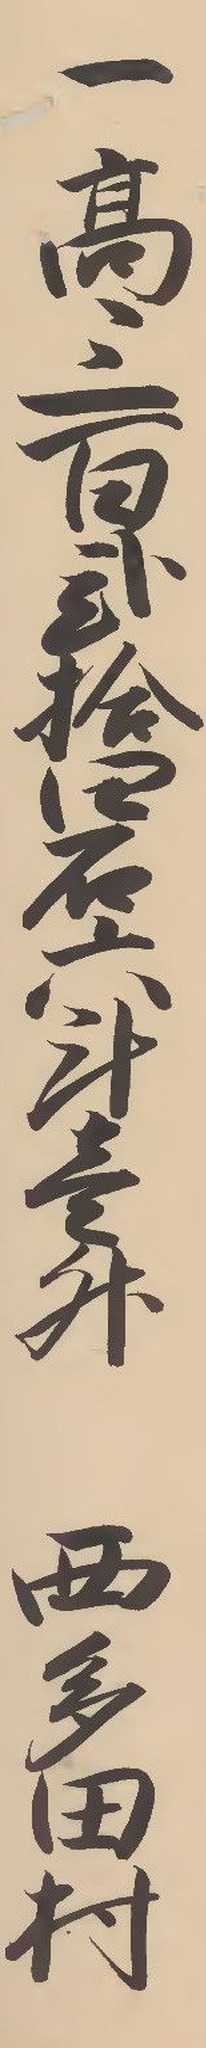一高三百弐拾四石六斗壱升西多田村
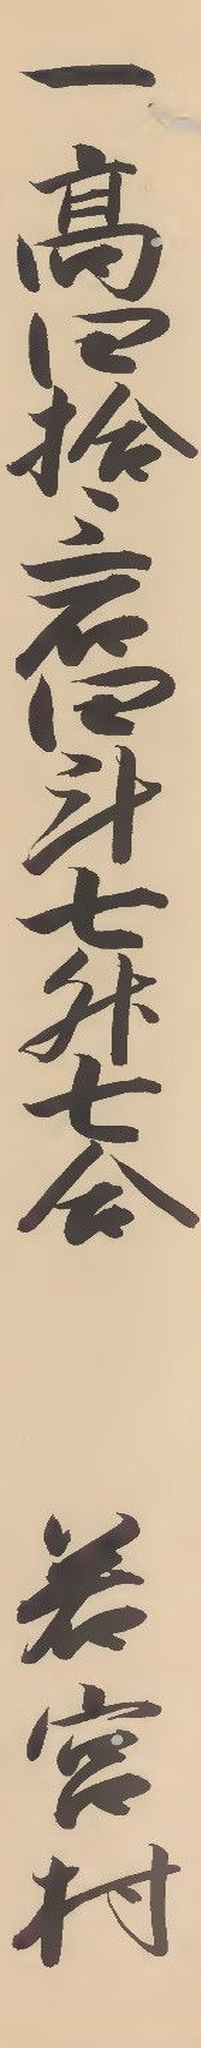一高四拾三石四斗七升七合若宮村
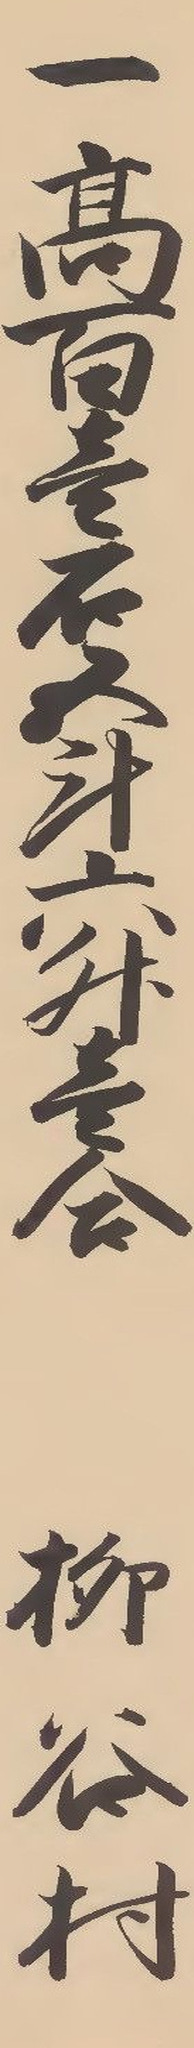一高百壱石五斗六升壱合柳谷村
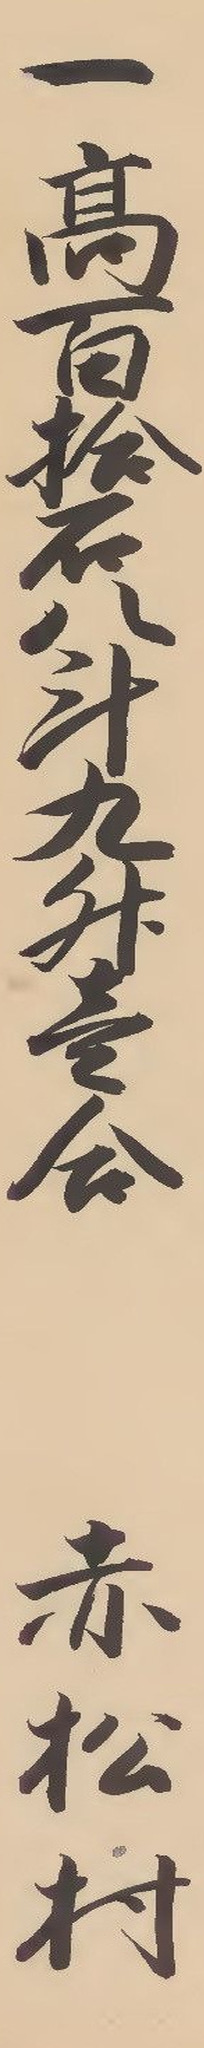一高百拾石八斗九升壱合赤松村

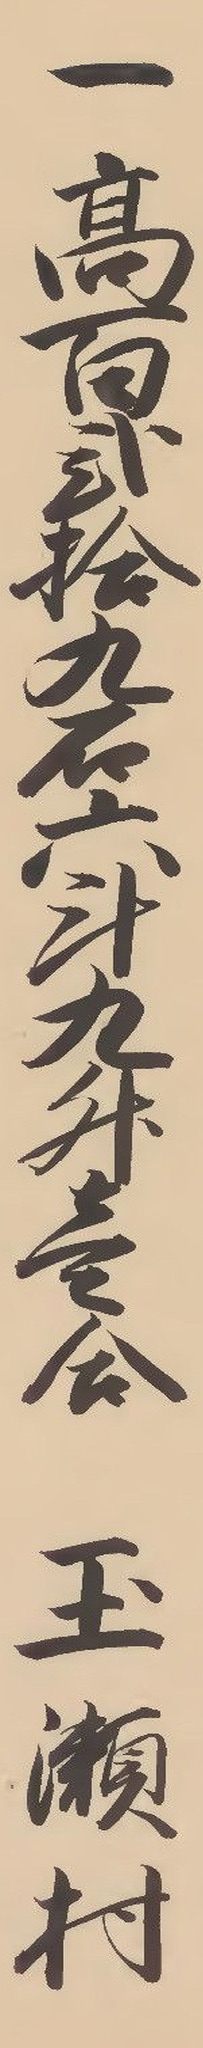一高百弐拾九石六斗九升壱合玉瀬村
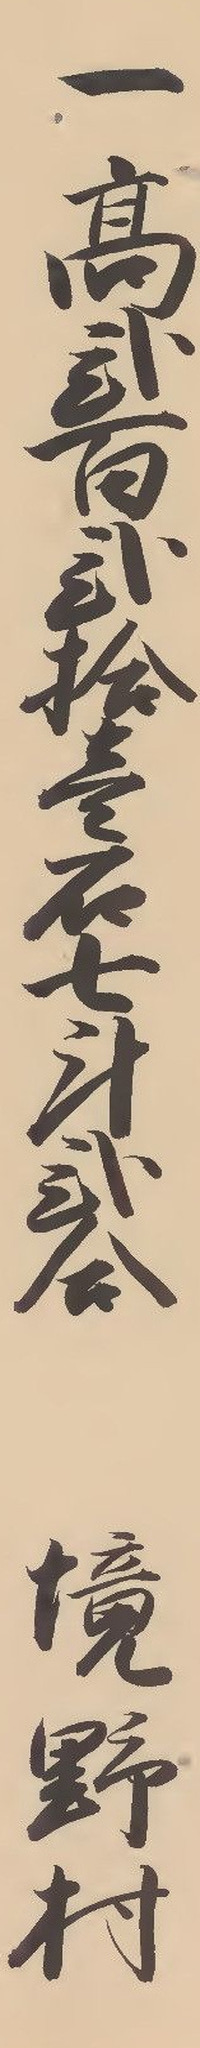一高弐百弐拾壱石七斗弐合境野村
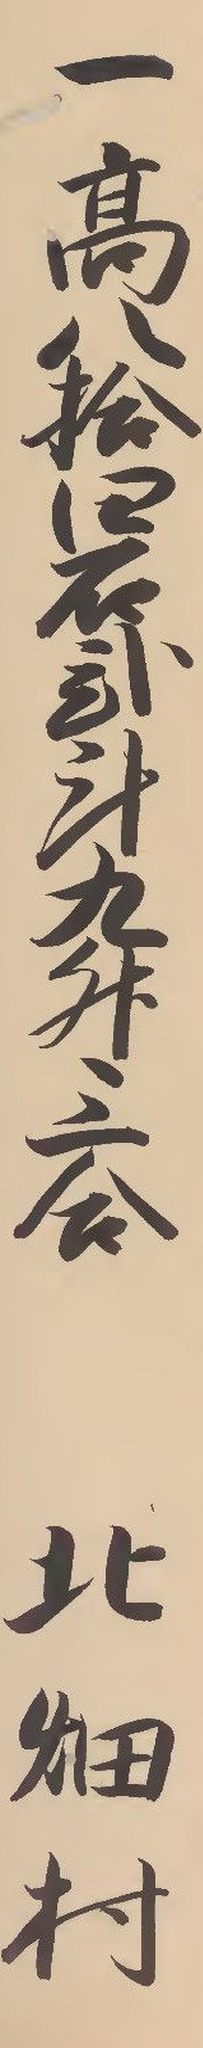一高八拾四石弐斗九升三合北畑村
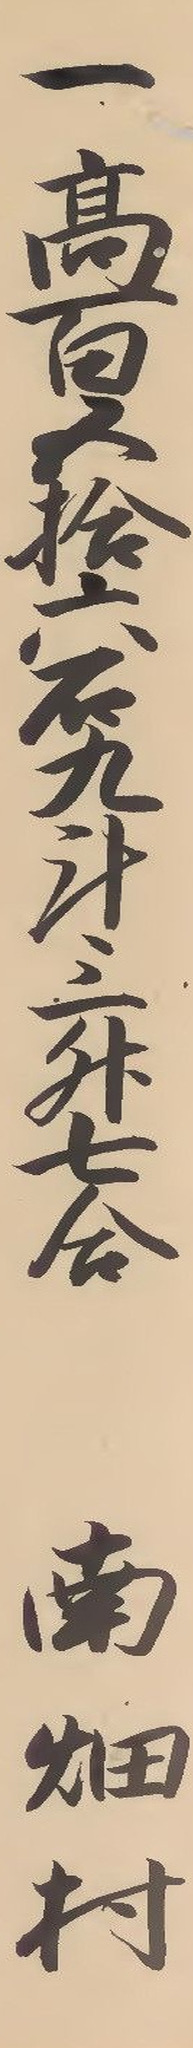一高百五拾六石九斗三升七合南畑村
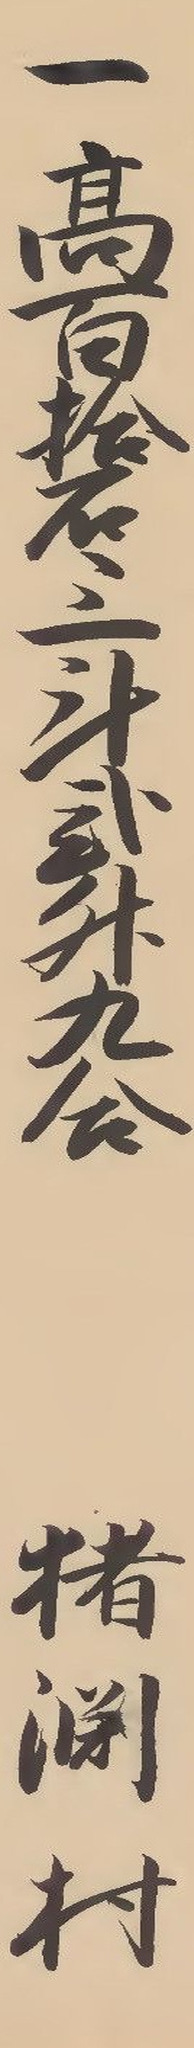一高百拾石三斗弐升九合猪淵村
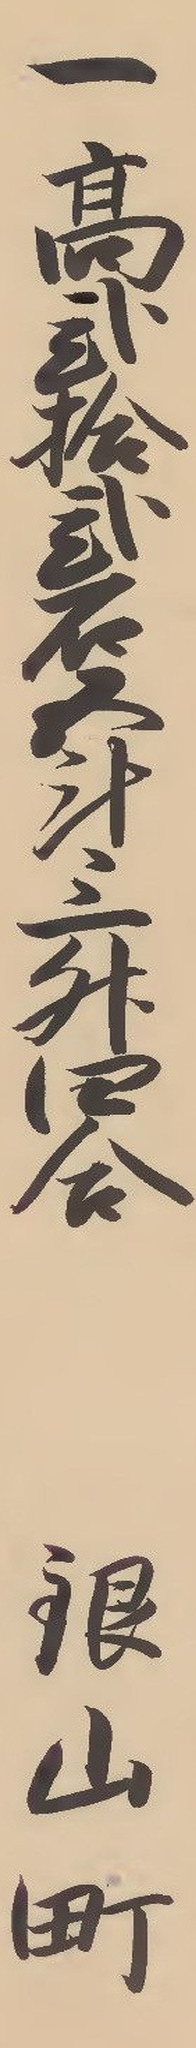一高弐拾弐石五斗三升四合銀山町

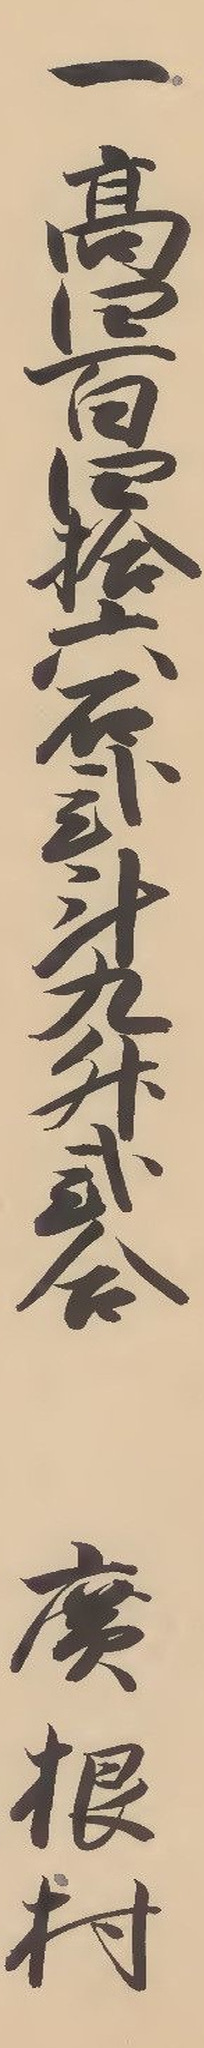一高四百四拾六石弐斗九升弐合広根村
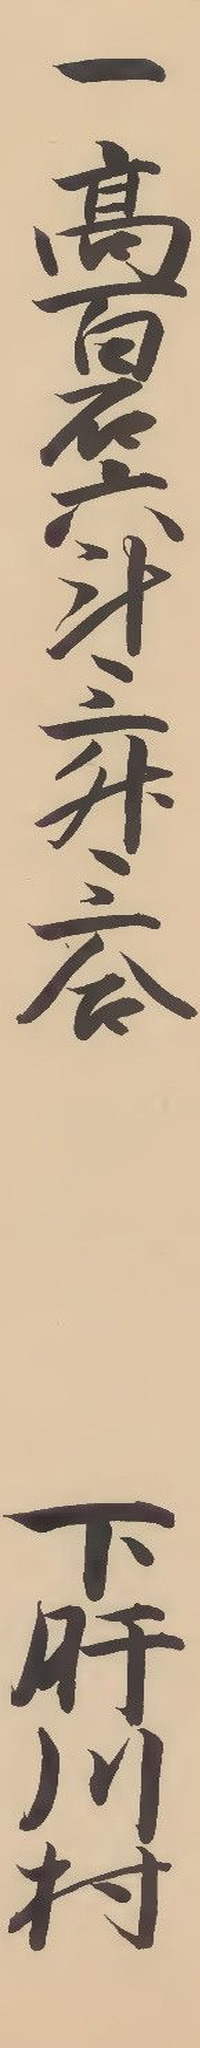一高百石六斗三升三合下肝川村
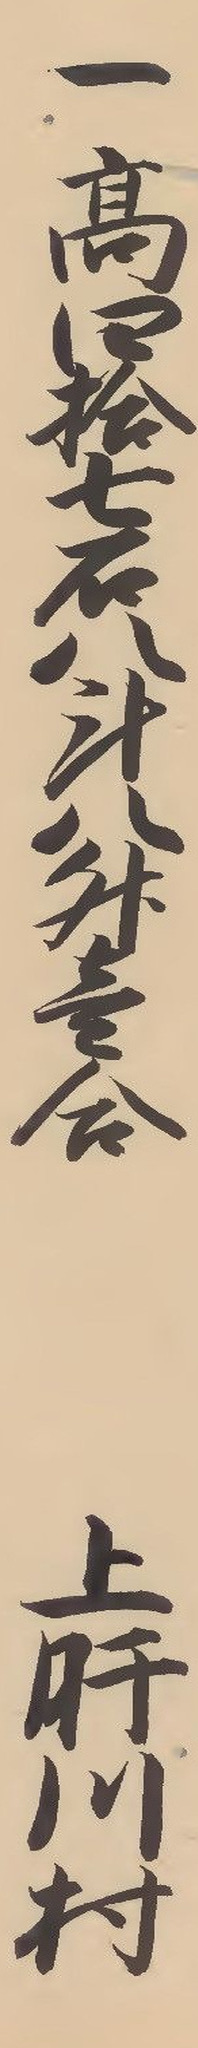一高四拾七石八斗八升壱合上肝川村
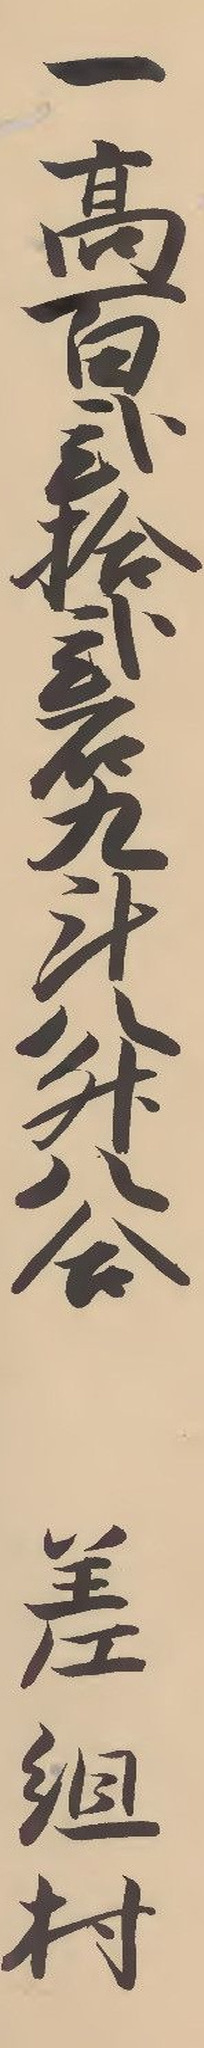一高百弐拾弐石九斗八升八合差組村
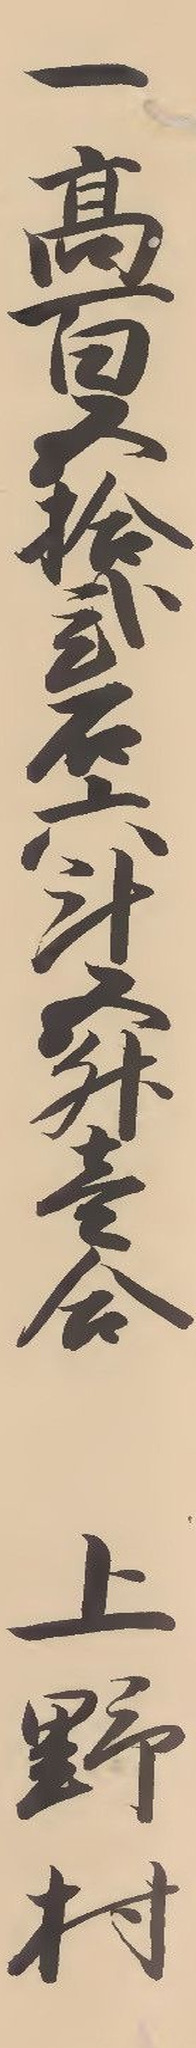一高百五拾弐石六斗五升壱合上野村
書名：摂津国郷帳
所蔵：国立公文書館 National Archives of Japan
